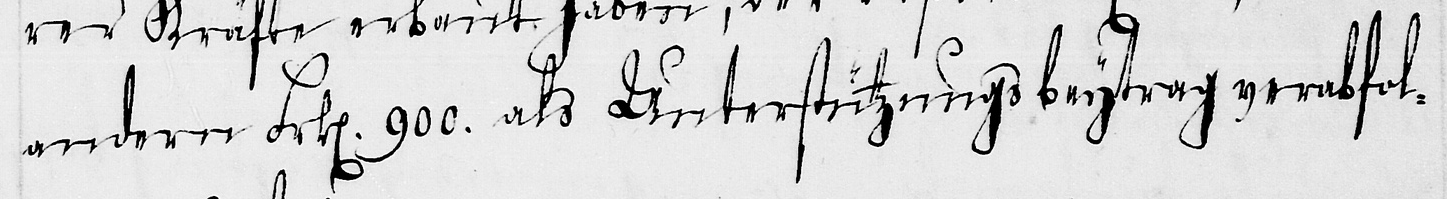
andern Frk. 900. als Unterstützungsbeytrag verabfol¬
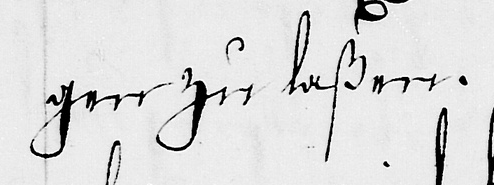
gen zu laßen.
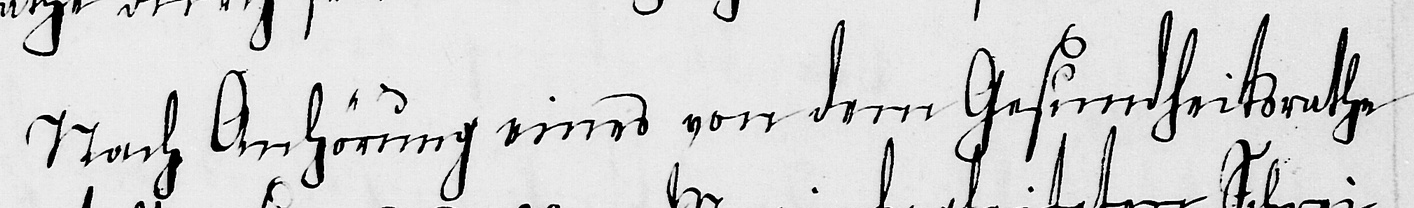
Nach Anhörung eines von dem Gesundheitsrathe
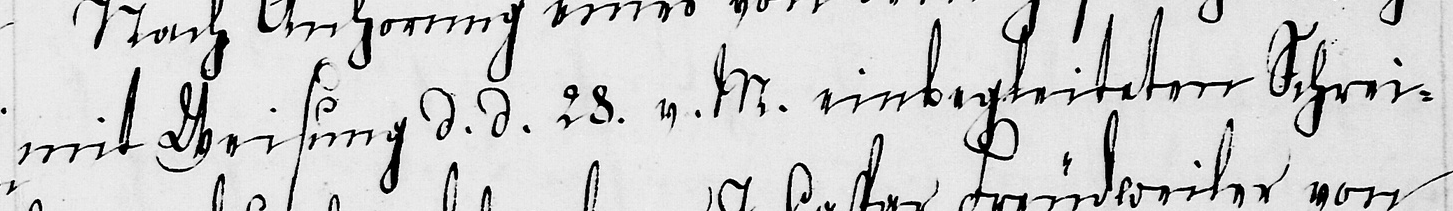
mit Weisung d. d. 28. v. M. einbegleitetem Schrei¬
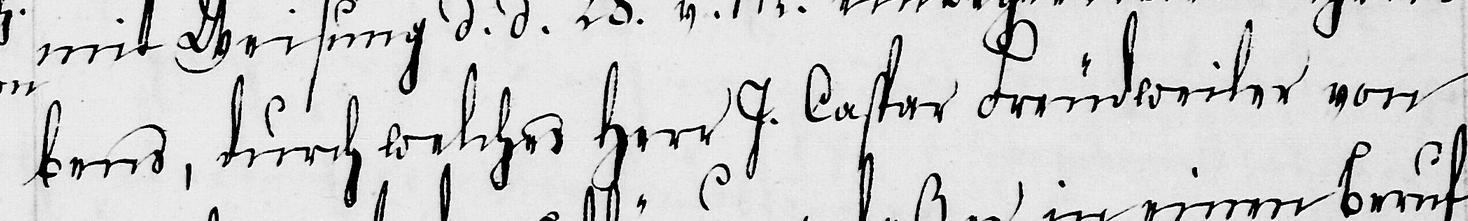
bens, durch welches Herr J. Caspar Freudweiler von
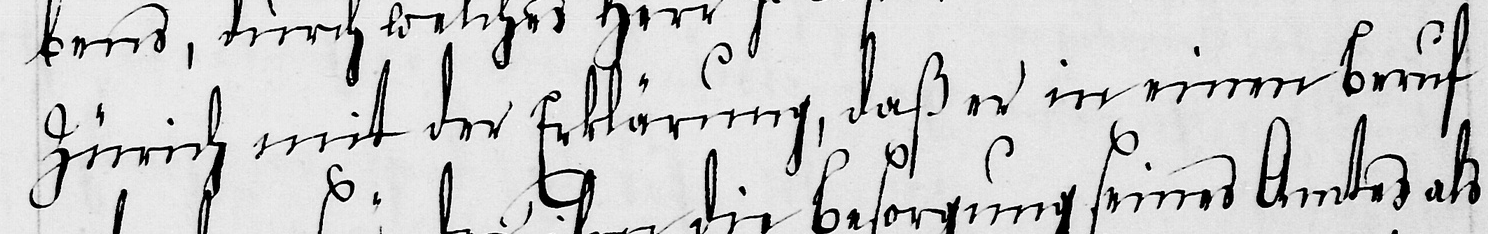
Zürich mit der Erklärung, daß er in einen Beruf
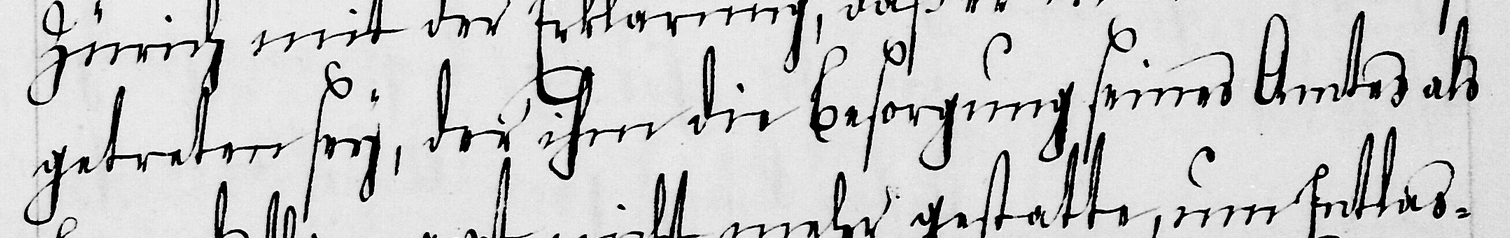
getreten sey, der ihm die Besorgung seines Amtes als
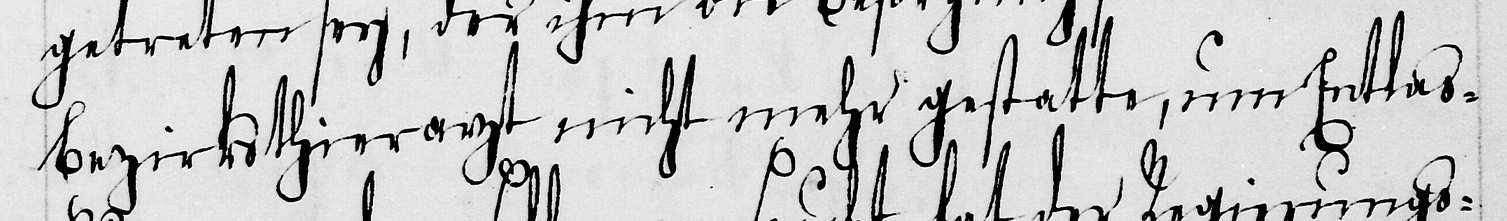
Bezirksthierarzt nicht mehr gestatte, um Entlas¬
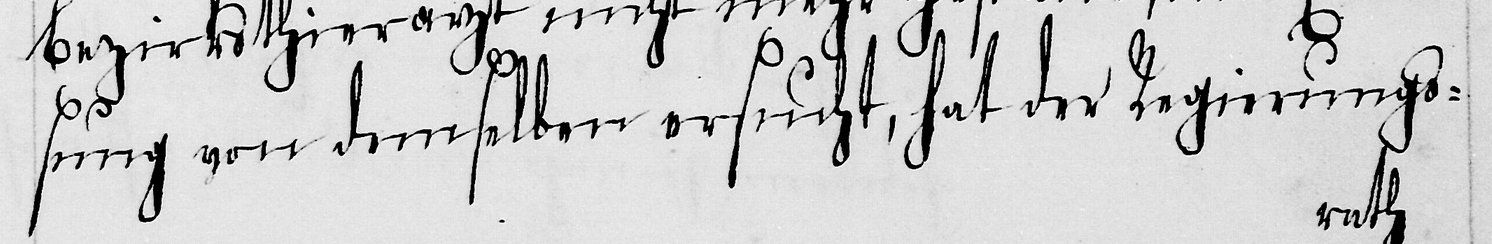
sung von demselben ersucht, hat der Regierungs-
